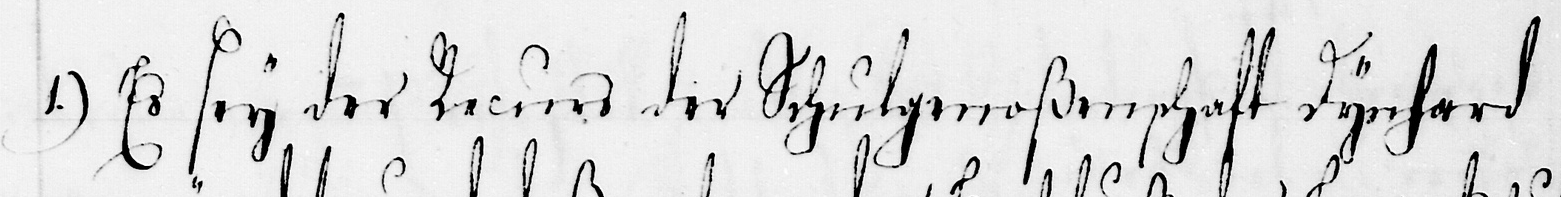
1.) Es sey der Recurs der Schulgenoßenschaft Dynhard
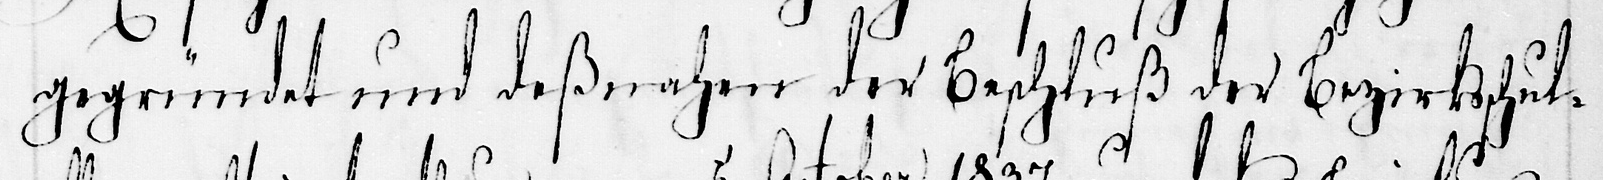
gegründet und deßnahen der Beschluß der Bezirksschul¬
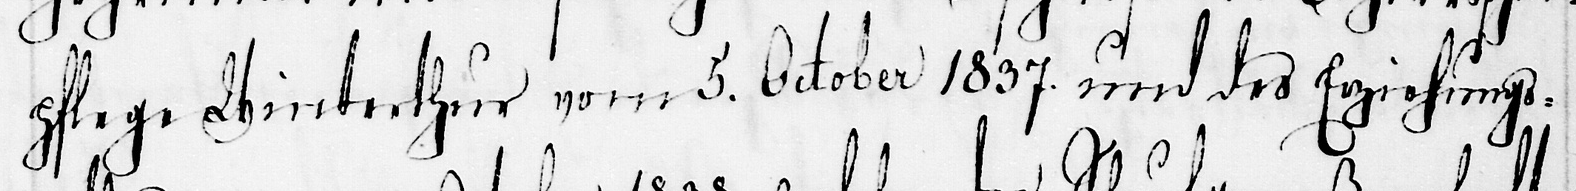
pflege Winterthur vom 5. October 1837. und des Erziehungs¬
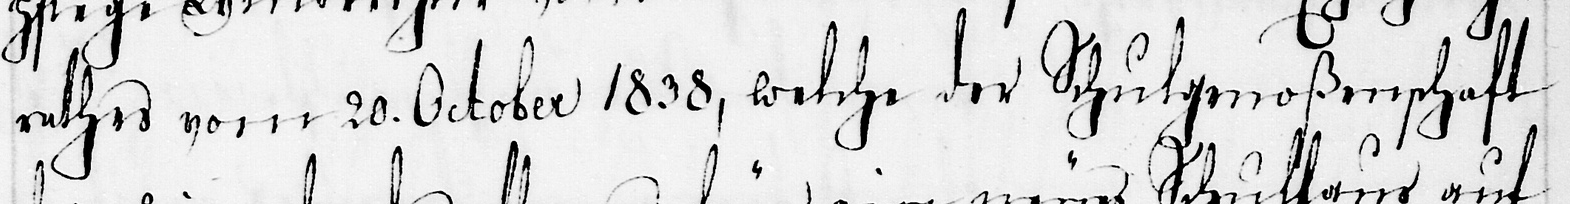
rathes vom 20. October 1838, welche der Schulgenoßenschaft
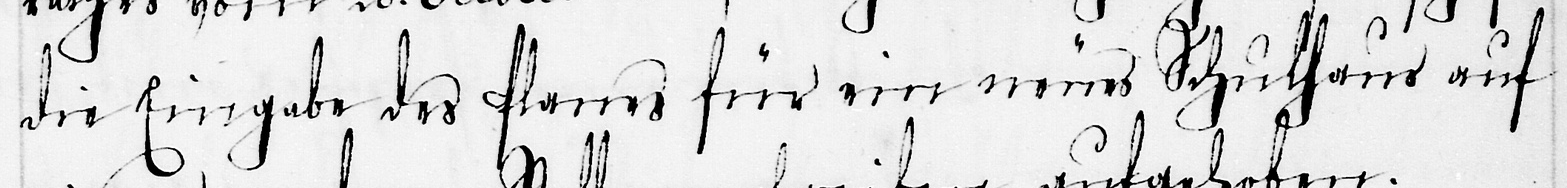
die Eingabe des Planes für ein neues Schulhaus auf
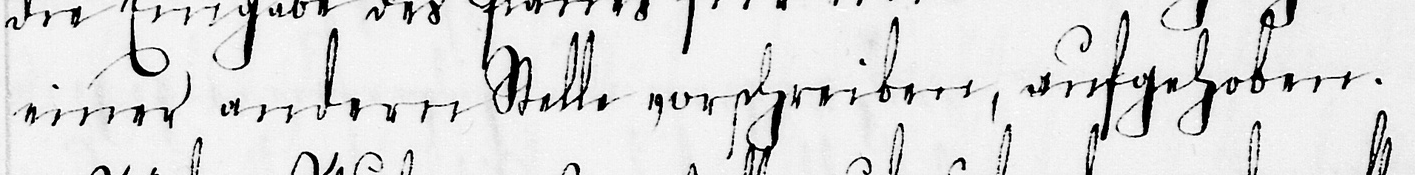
einer andern Stelle vorschreiben, aufgehoben.
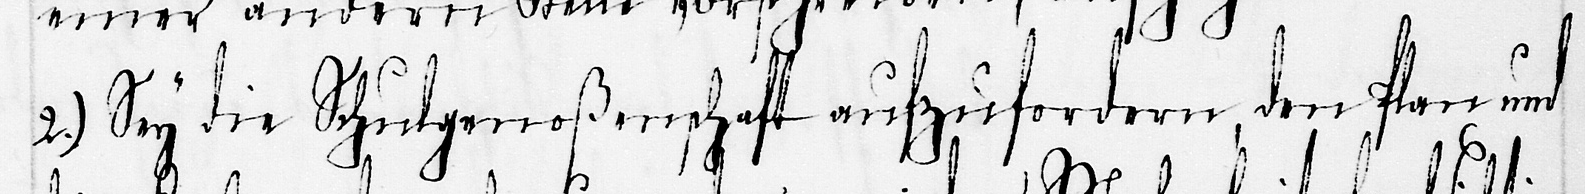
2.) Sey die Schulgenoßenschaft aufzufordern, den Plan und
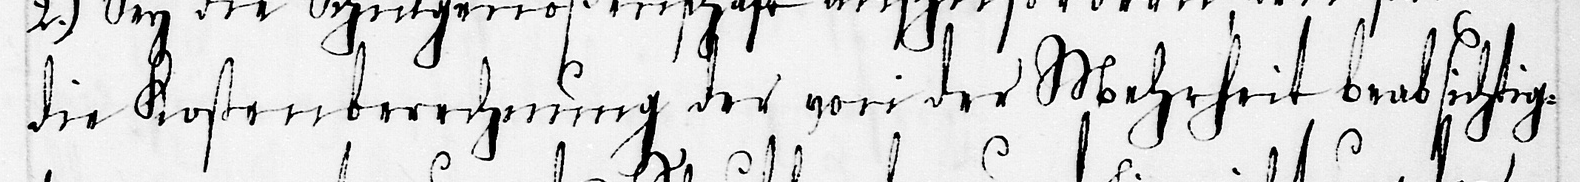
die Kostenberechnung der von der Mehrheit beabsichtig¬
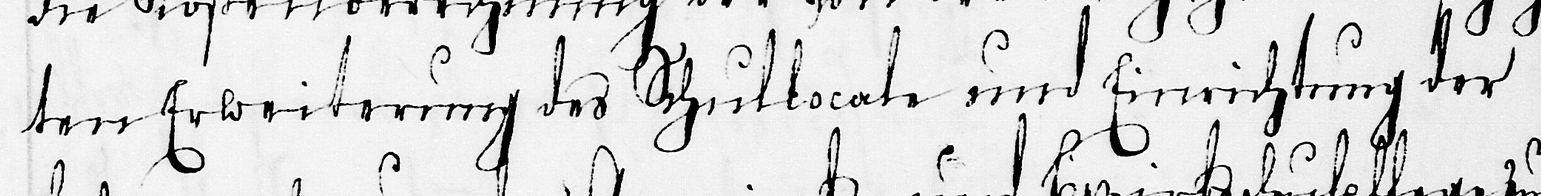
ten Erweiterung des Schullocale und Einrichtung der
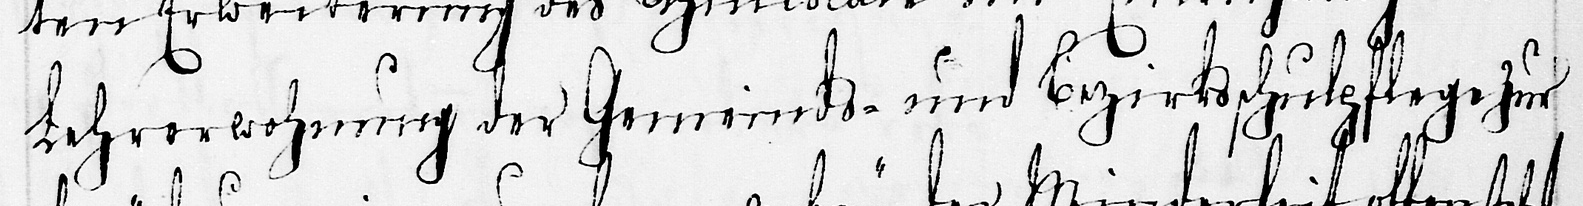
Lehrerwohnung der Gemeinds- und Bezirksschulpflege zur
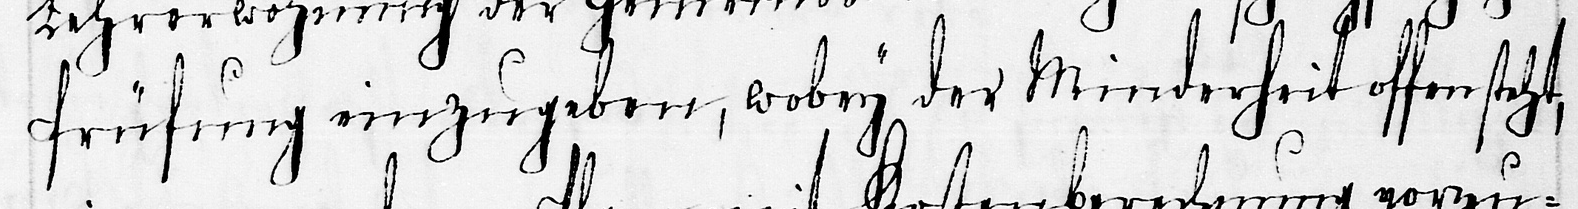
Prüfung einzugeben, wobey der Minderheit offensteht,
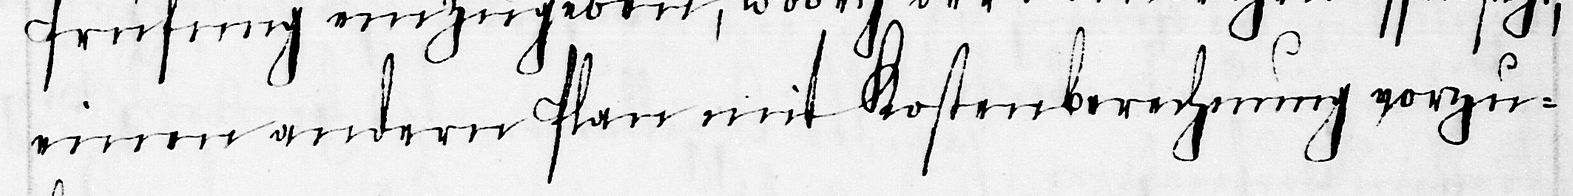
einen andern Plan mit Kostenberechnung vorzu¬
